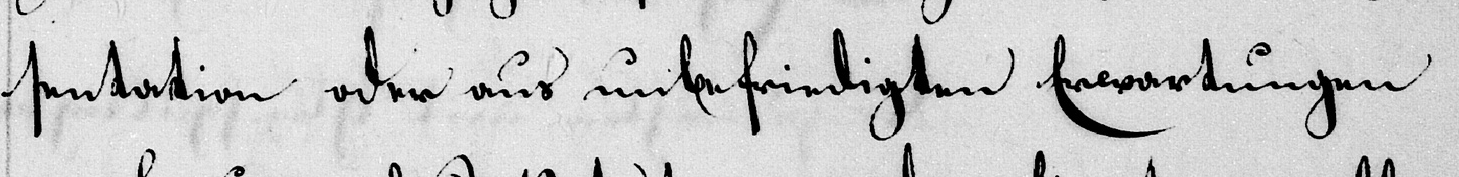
sentation oder aus unbefriedigten Erwartungen
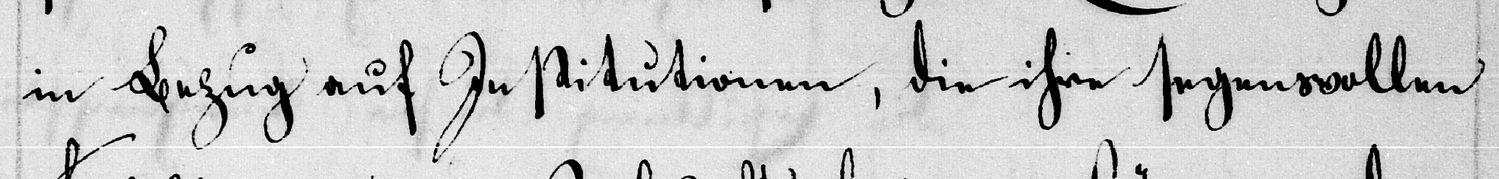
in Bezug auf Institutionen, die ihre segensvollen
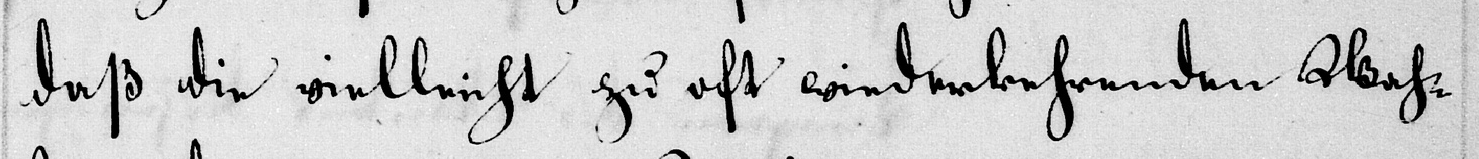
daß die vielleicht zu oft wiederkehrenden Wah¬
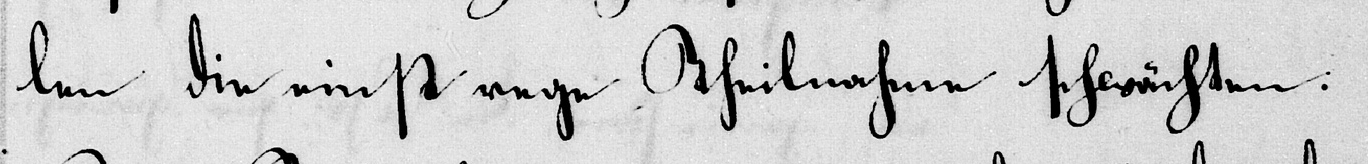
len die einst rege Theilnahme schwächten:
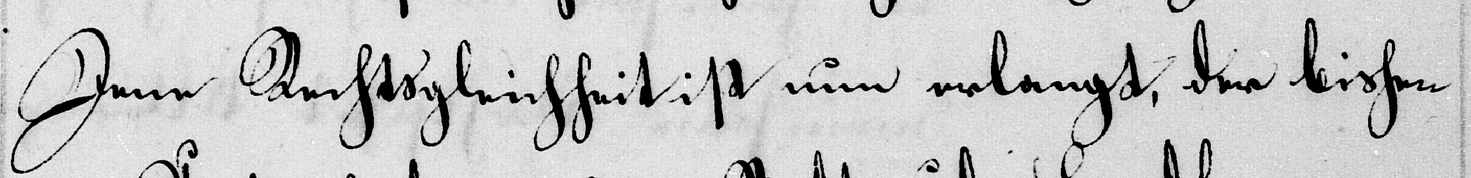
Jene Rechtsgleichheit ist nun erlangt, der bishe¬
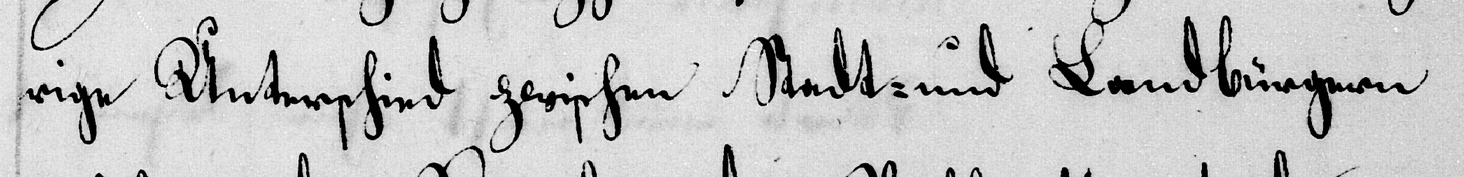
rige Unterschied zwischen Stadt- und Landbürgern
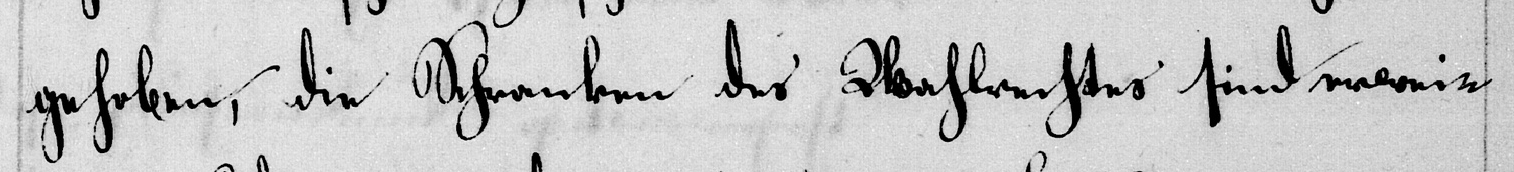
gehoben, die Schranken des Wahlrechtes sind erwe¬
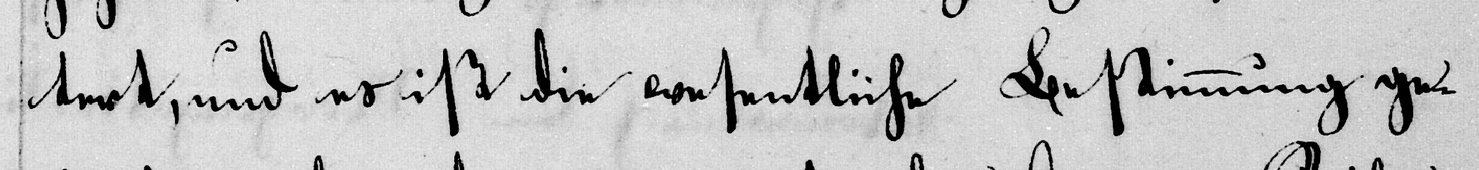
itert, und es ist die wesentliche Bestimmung ge¬
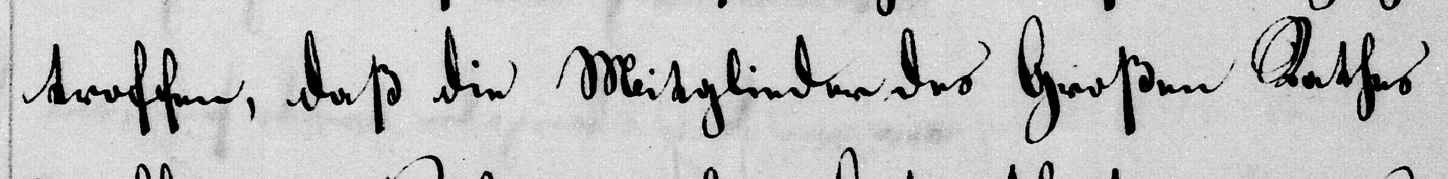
troffen, daß die Mitglieder des Großen Rathes
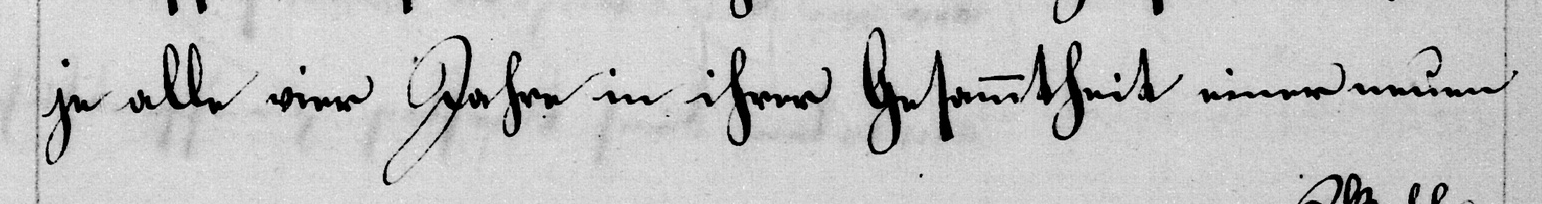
je alle vier Jahre in ihrer Gesammtheit einer neuen
